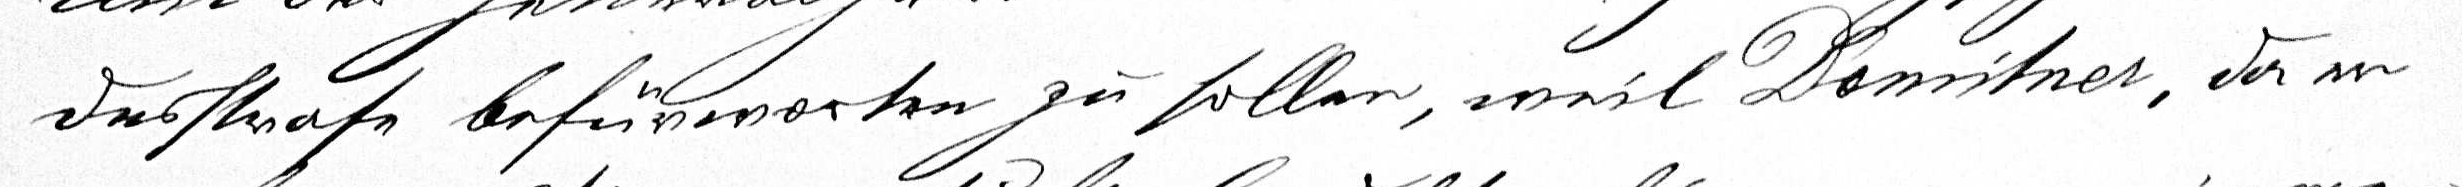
desstrafe befürworten zu sollen, weil Domitner, da er
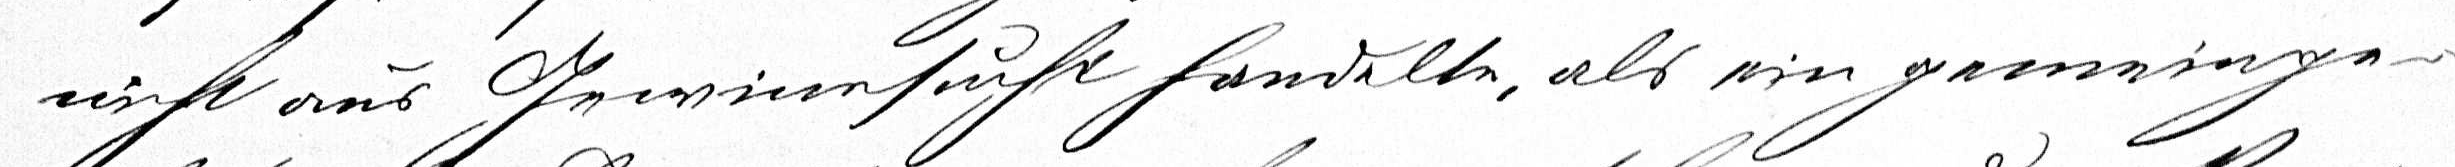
nicht aus Gewinnsucht handelte, als ein gemeinge¬
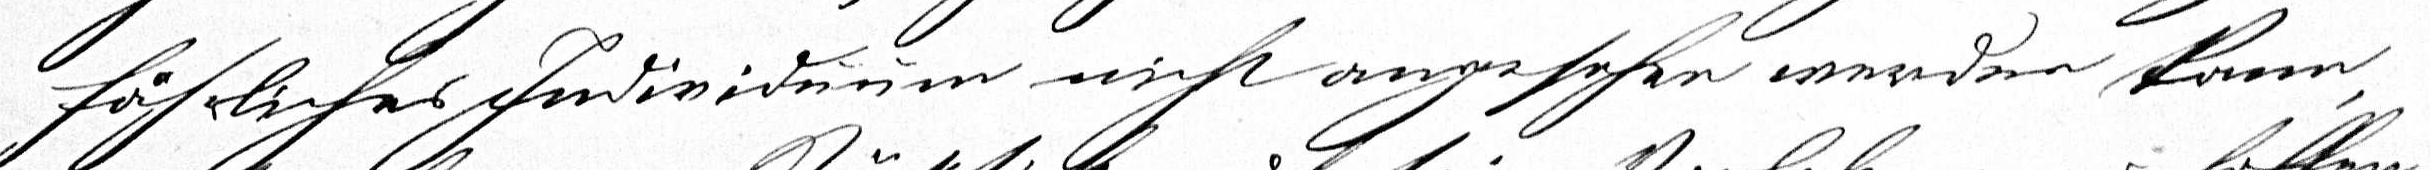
fährliches Individuum nicht angesehen werden kann,
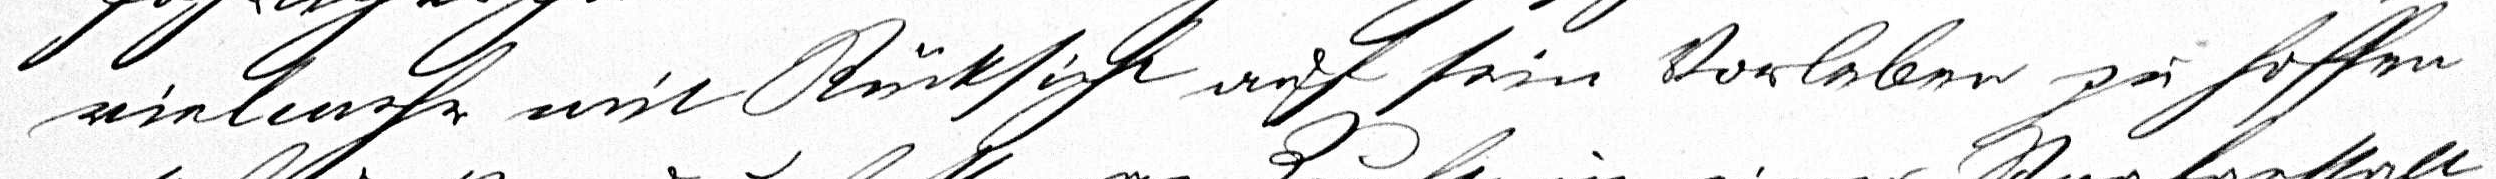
vielmehr mit Rücksicht auf sein Vorleben zu hoffen
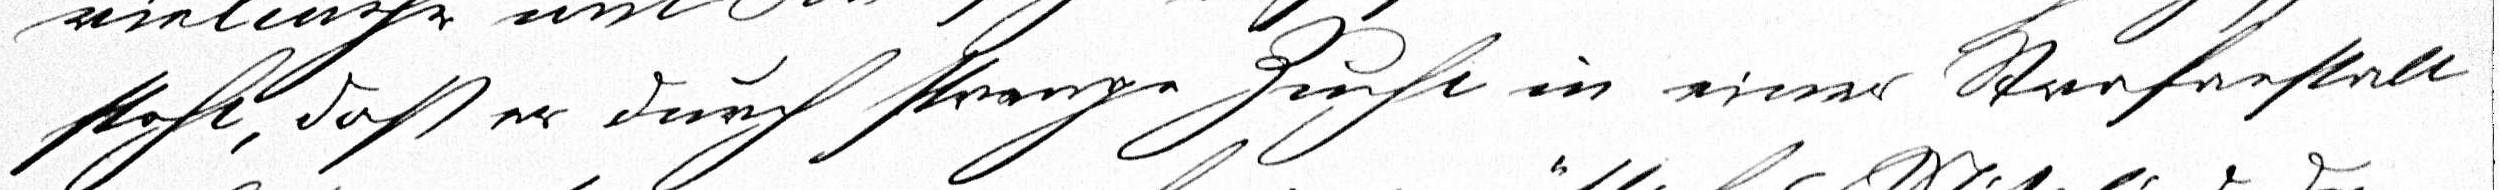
steht, daß er durch strenge Zucht in einer Strafanstalt
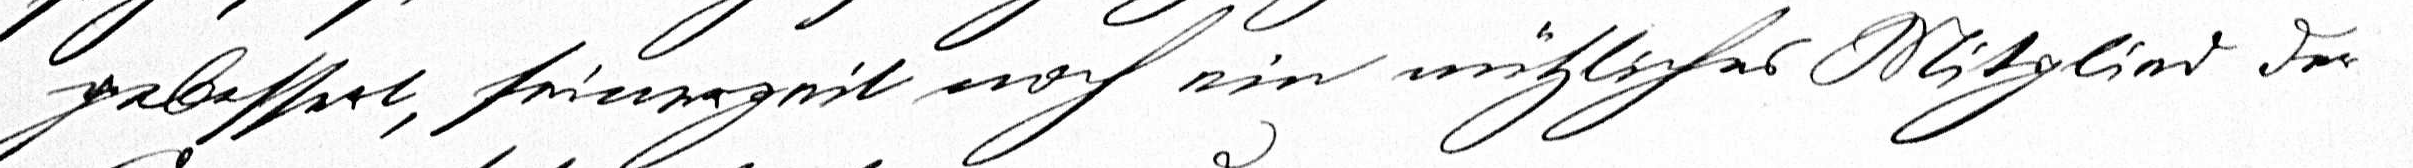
gebessert, seinerzeit noch ein nützliches Mitglied der
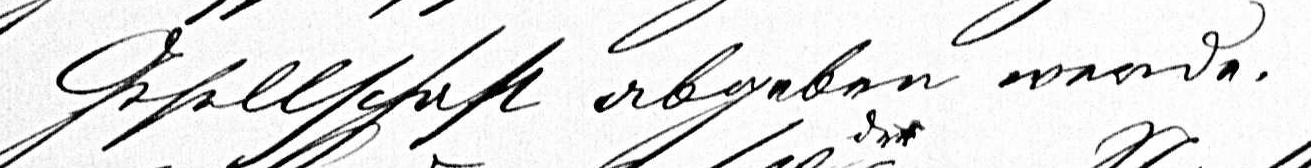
Gesellschaft abgeben werde.
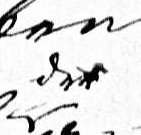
der
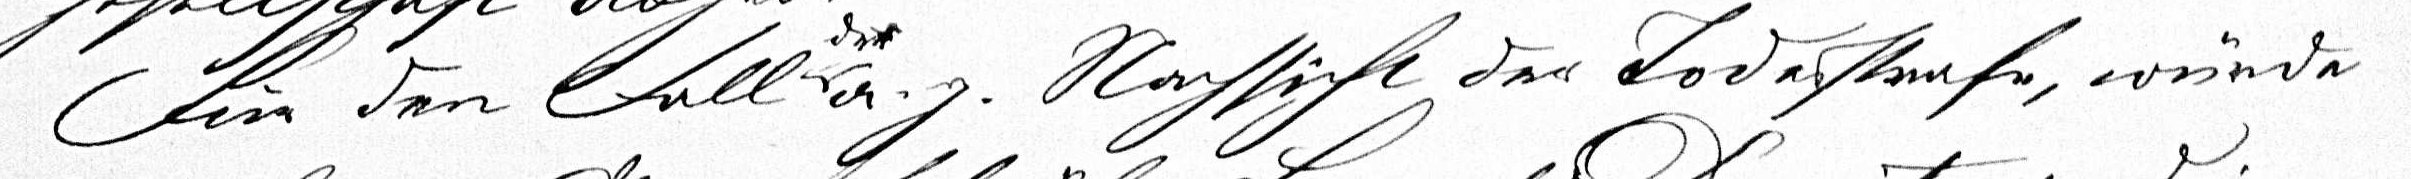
Für den Fall a.g. Nachsicht der Todesstrafe, würde
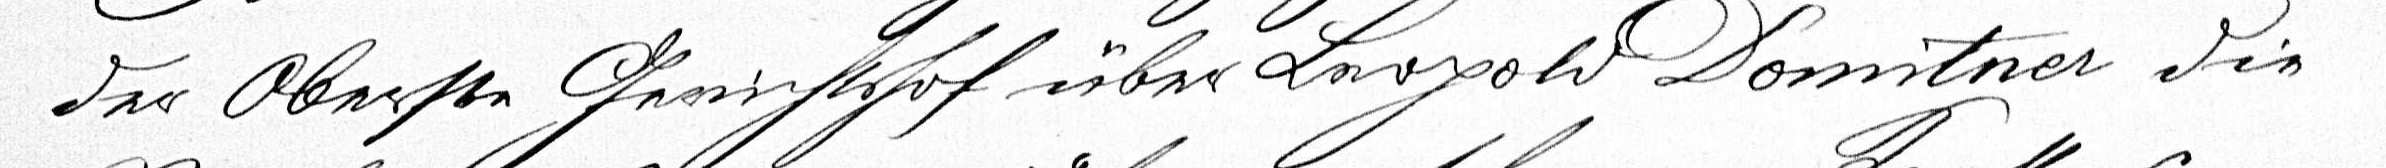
der Oberste Gerichtshof über Leopold Domitner die
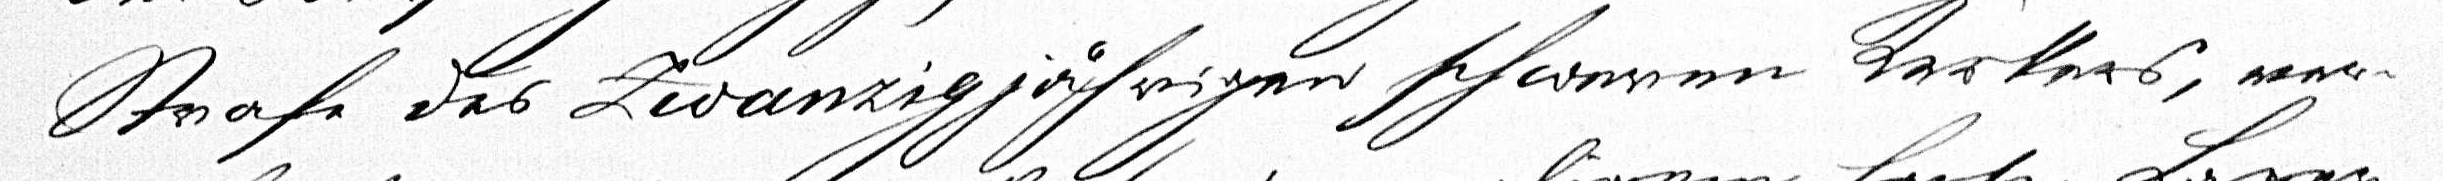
Strafe des Zwanzigjährigen schweren Kerkers, ver¬
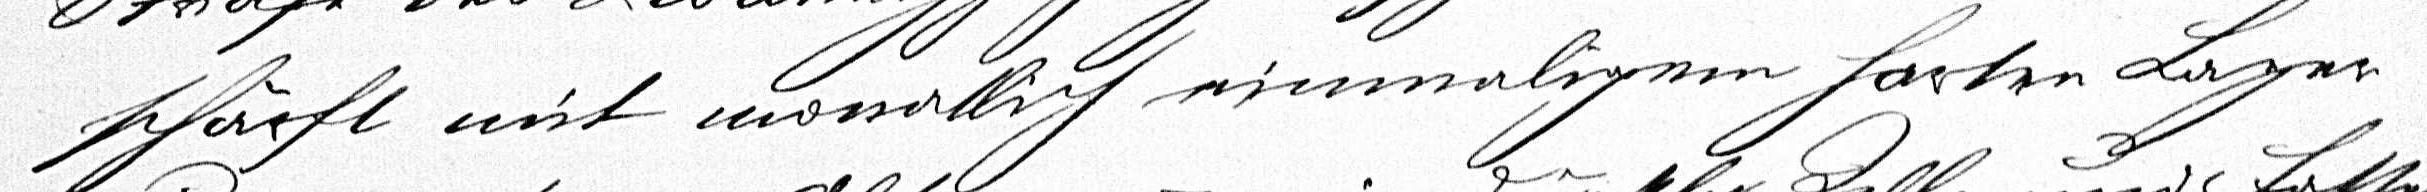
schärft mit monatlich einmaligem harten Lager
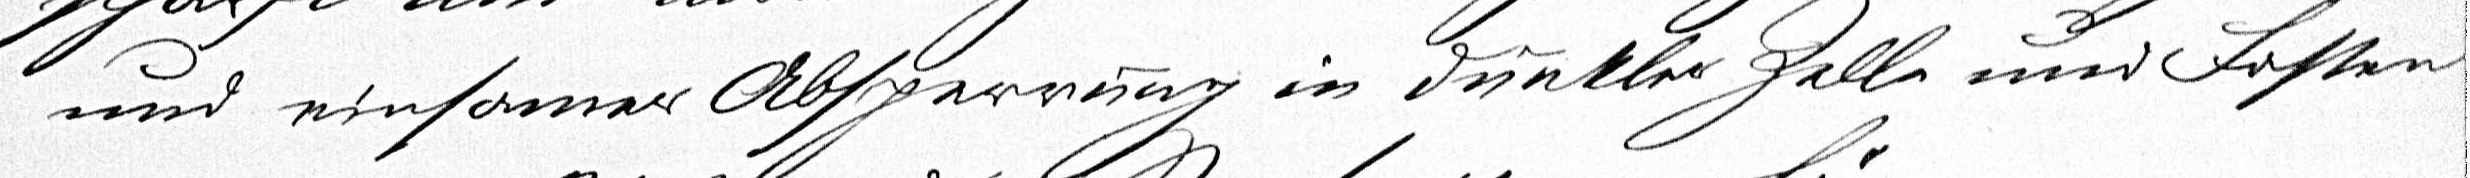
und einsamer Absperrung in dunkler Zelle und Fasten
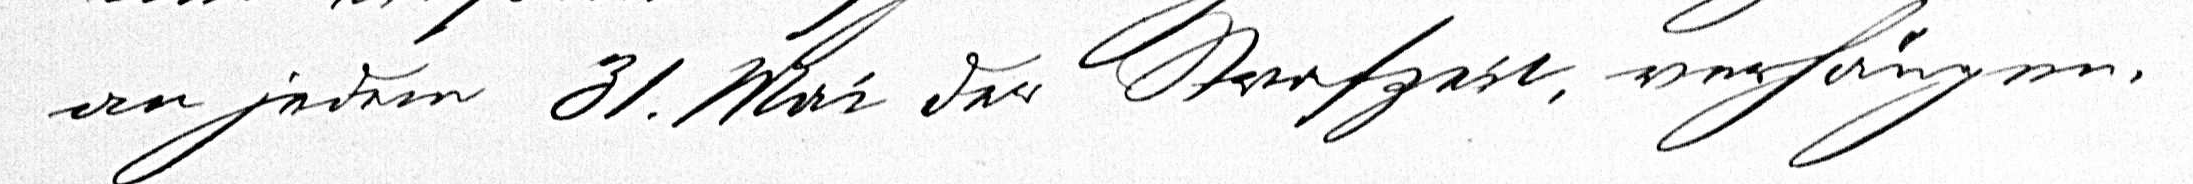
an jedem 31. Mai der Strafzeit verhängen.
